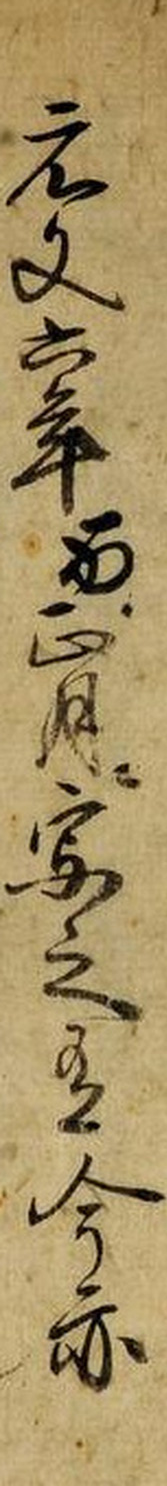元文六年酉正月ニ写之有今亦
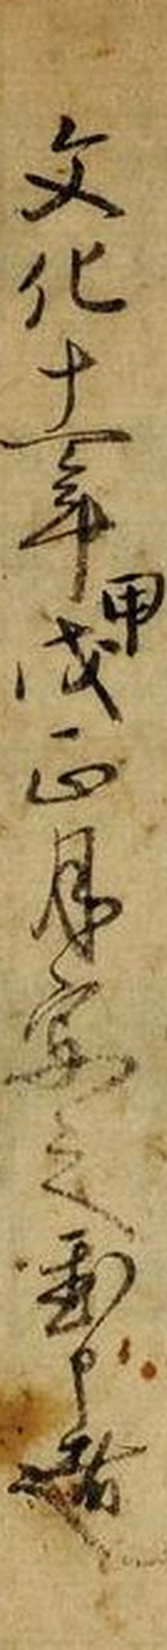文化十一年甲戌正月写之置申者也
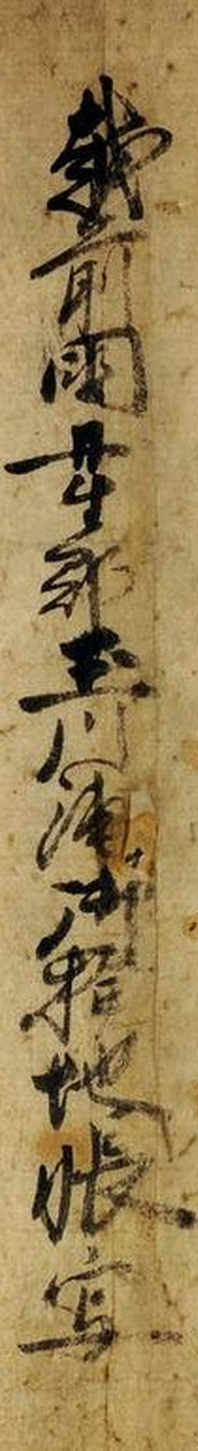越前国丹生郡玉川浦御検地帳写
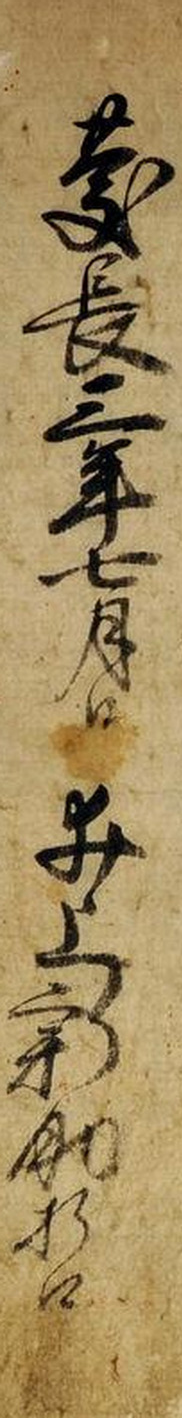慶長三年七月日井上新助打口

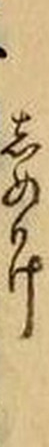しめかけ
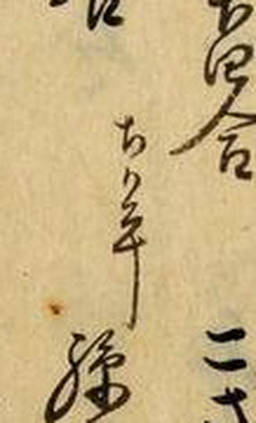ちか平
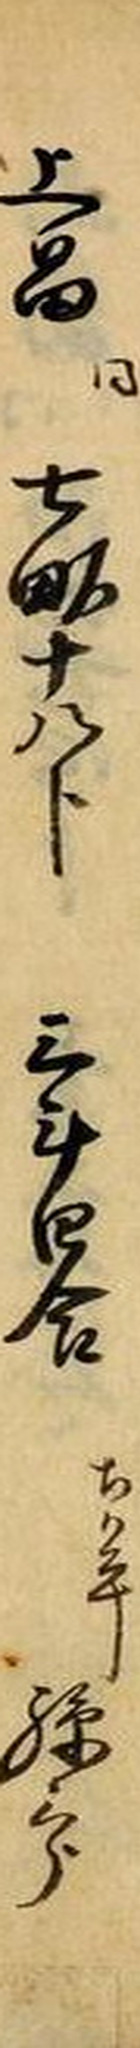上畠同七畝十八歩三斗四合孫三郎
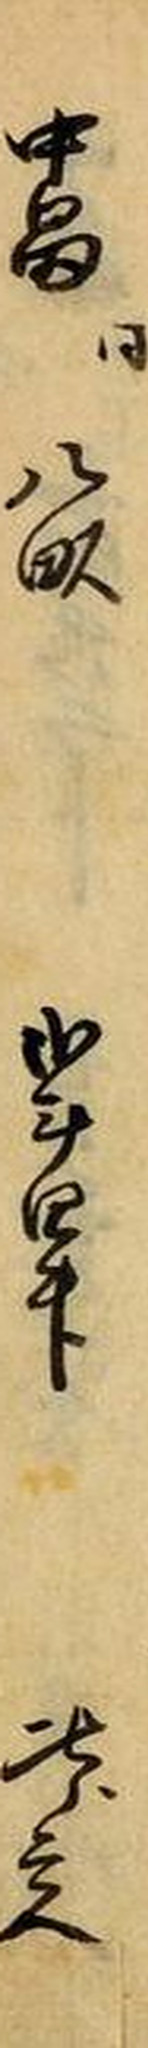中畠同八畝弐斗四升次郎兵へ
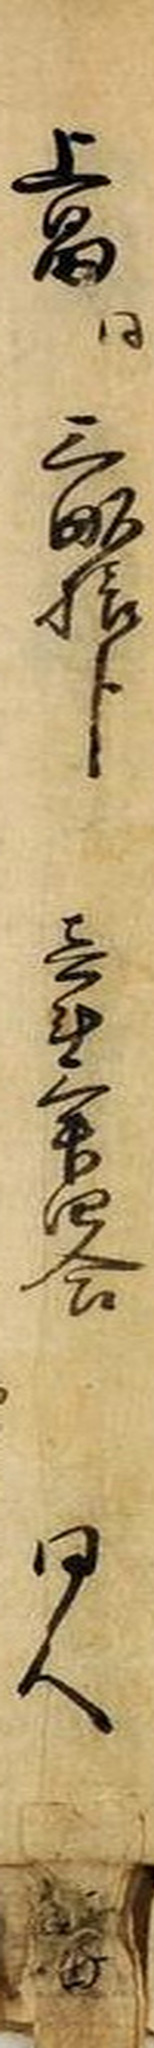上畠同三畝拾歩壱斗三升四合同人
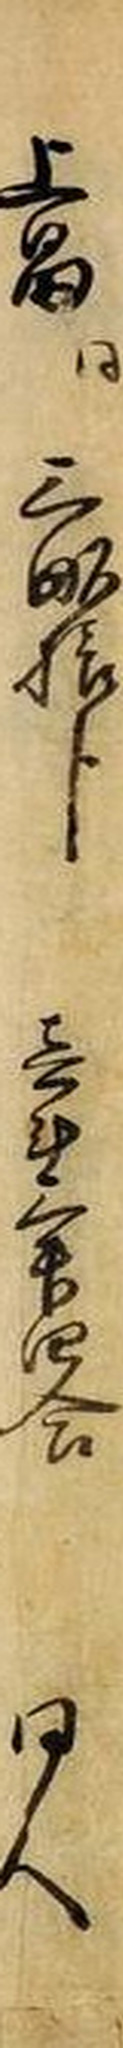上畠同三畝拾歩壱斗三升四合同人
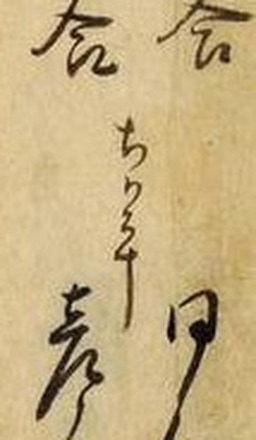ちか平
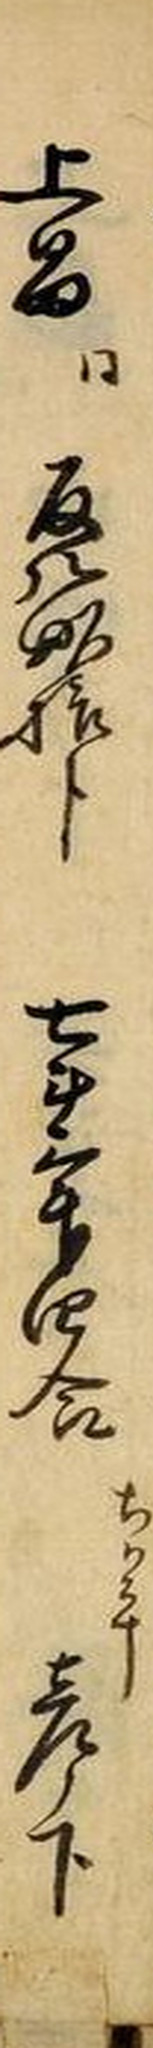上畠同反八畝拾歩七斗三升四合彦ノ下
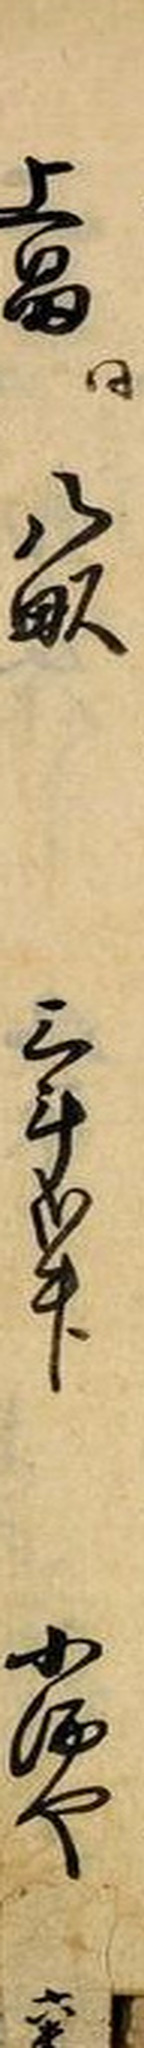上畠同八畝三斗弐升小酒や

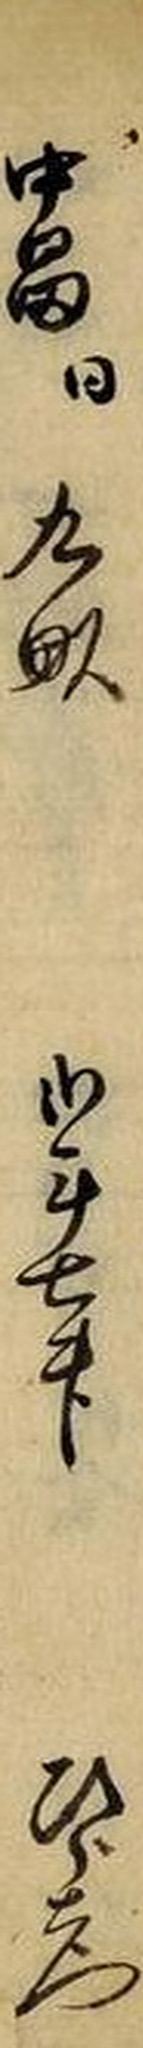中畠同九畝弐斗七升次郎右衛門
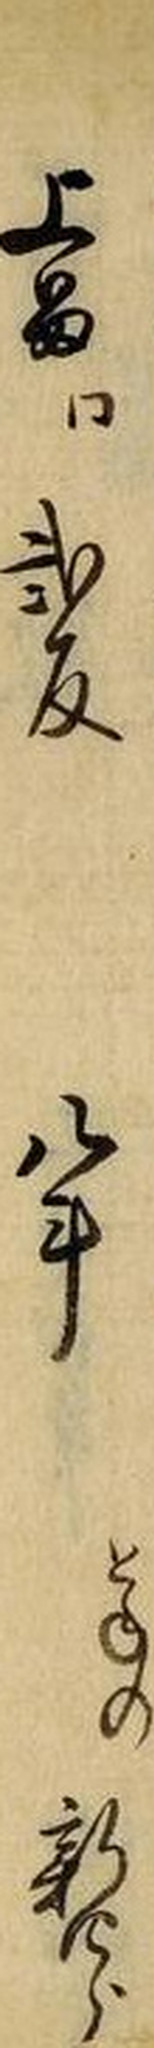上畠同弐反八斗とねの新四郎
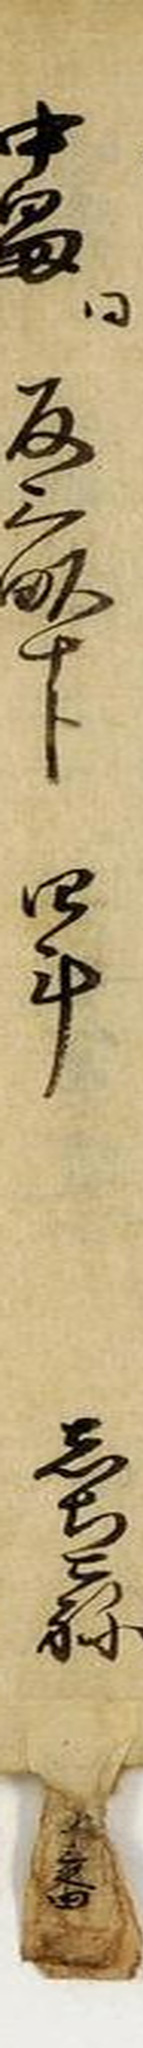中畠同反三畝十歩四斗しちとね
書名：慶長三年七月越前国丹生郡玉川浦御検地帳写
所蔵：福井県文書館 Fukui Prefectural Archives
